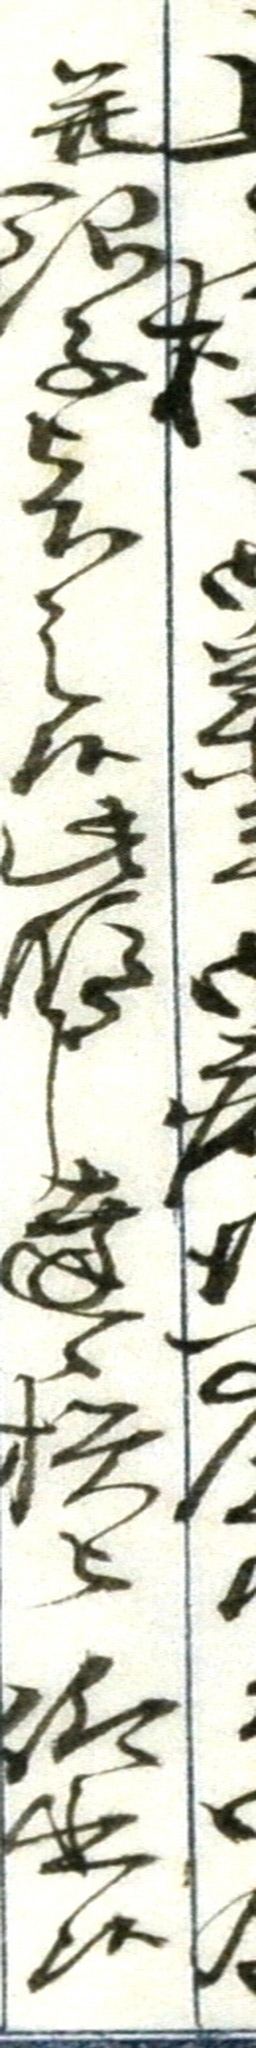幷銀子被下之候此段申達候様被仰出候
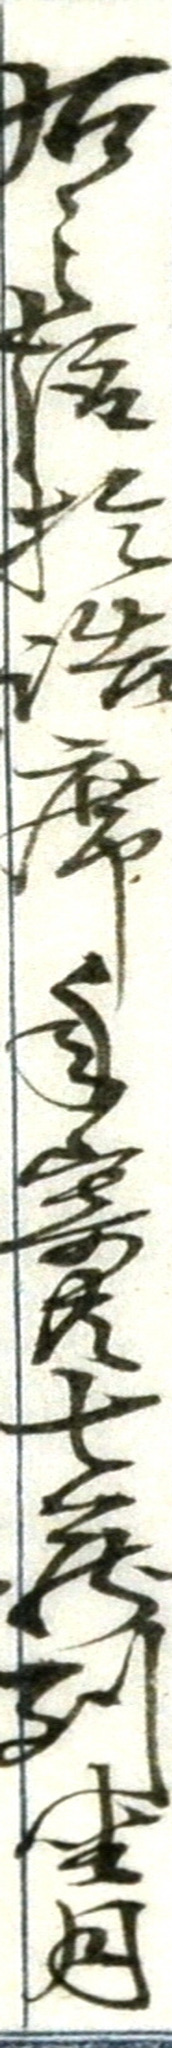右之趣於詰席年寄共七藏列座月
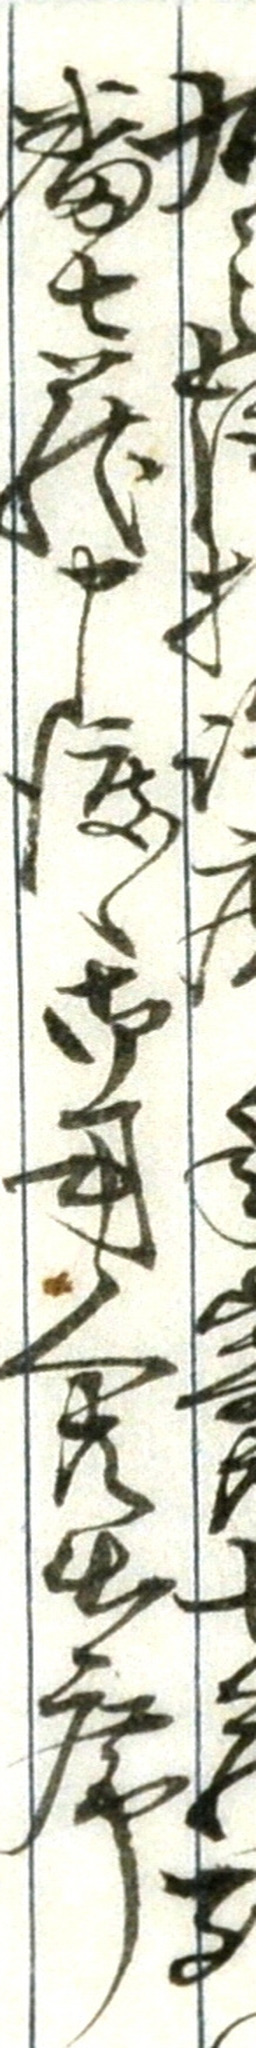番七藏申渡候御用人共出席

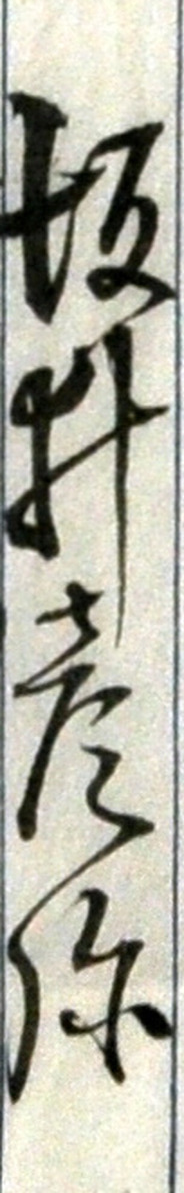坂井彦弥
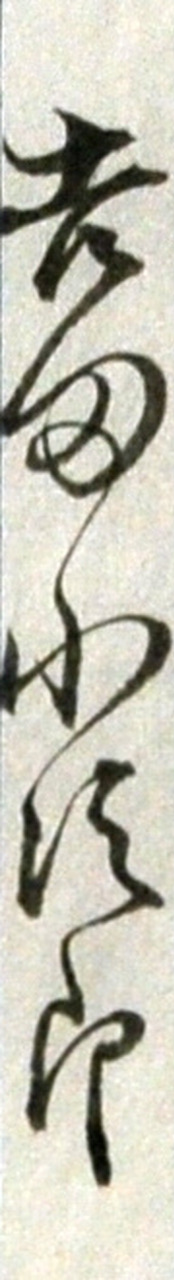吉田小次郎
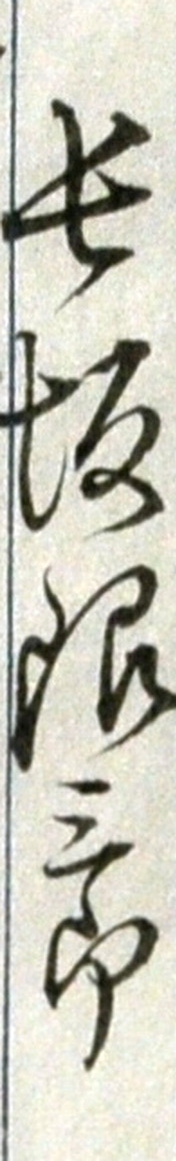長坂銀三郎
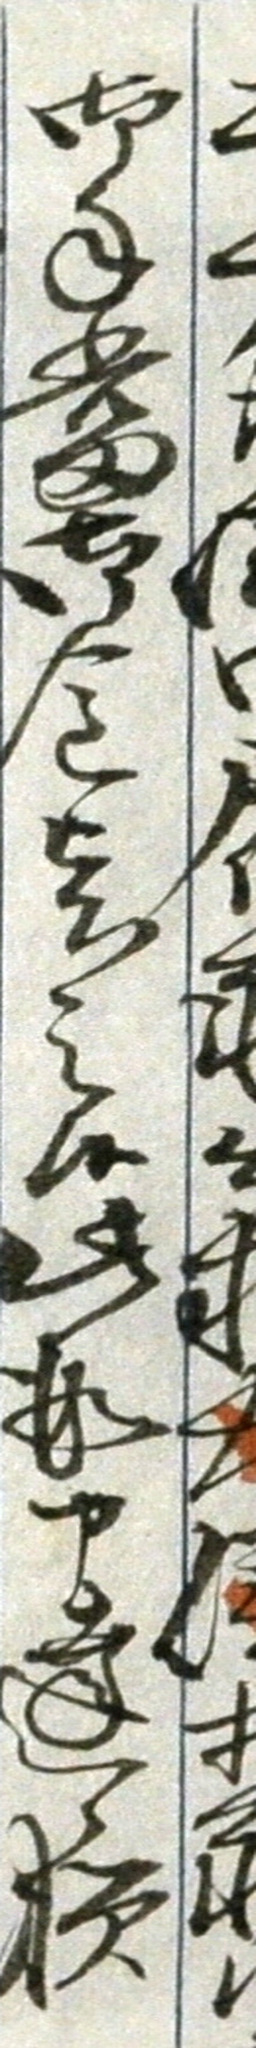御手当御金被下之候此如申達候様
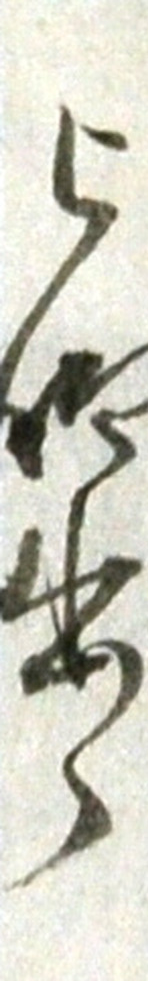被仰出候
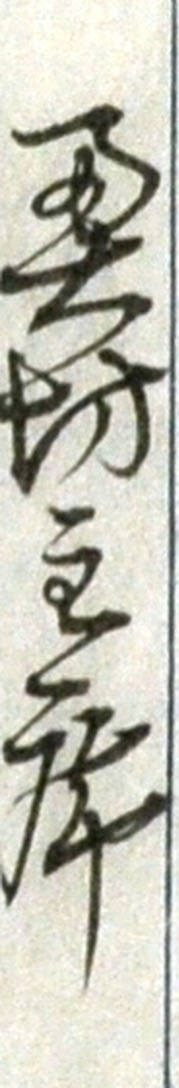奥坊主席
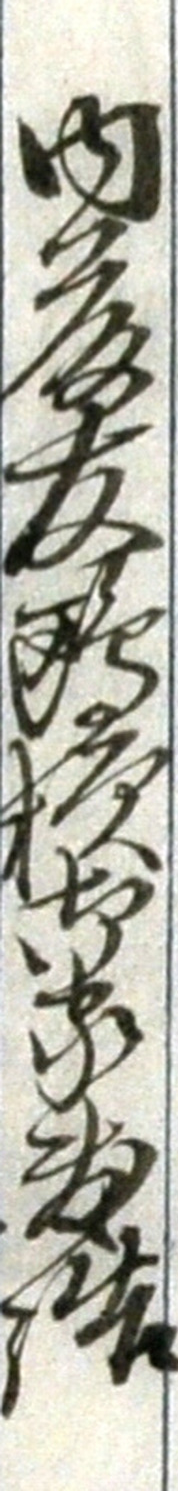内藤友鵬様御家敷詰
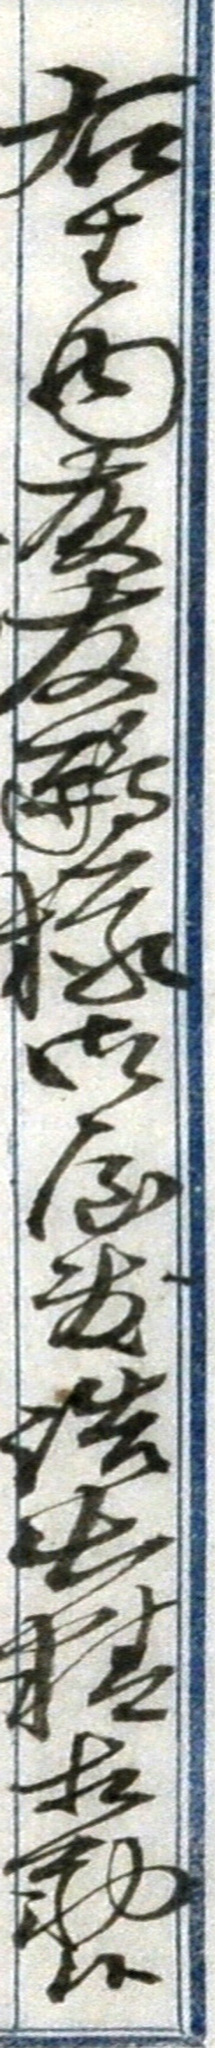右者内藤友鵬様御家敷詰出精相勤候
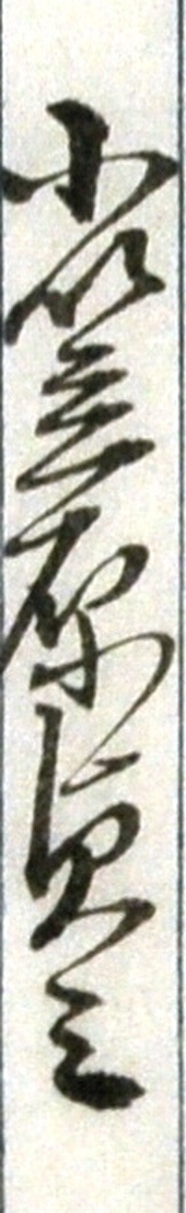小笠原貞三
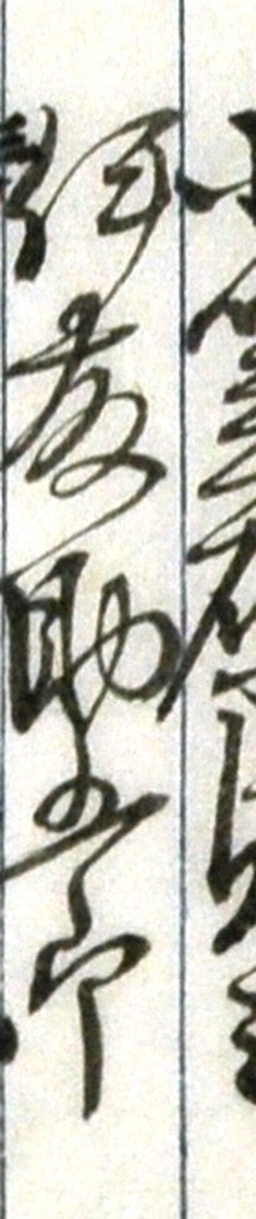伊藤助五郎
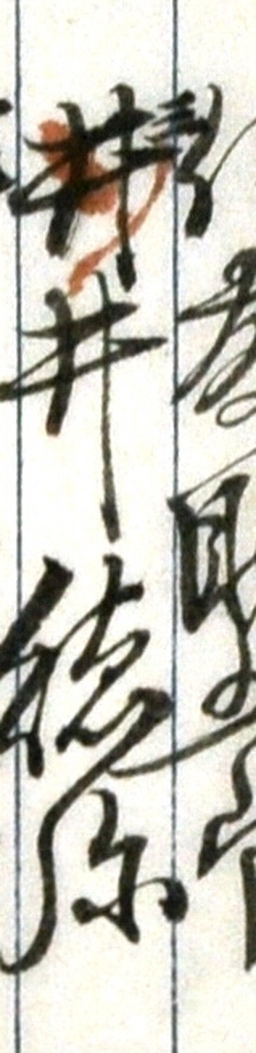三井徳弥
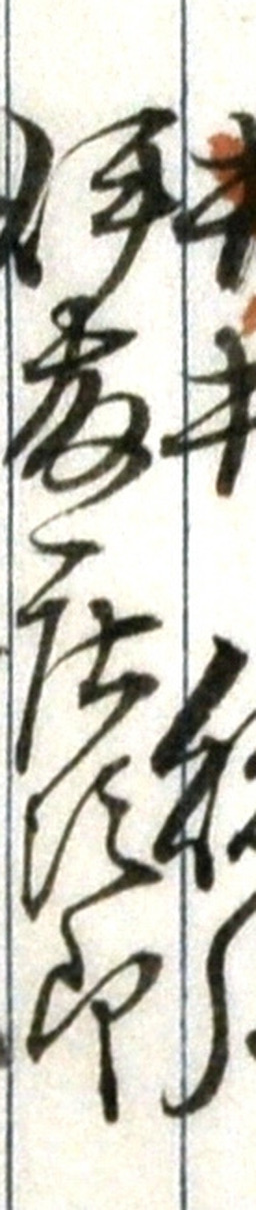伊藤庄次郎
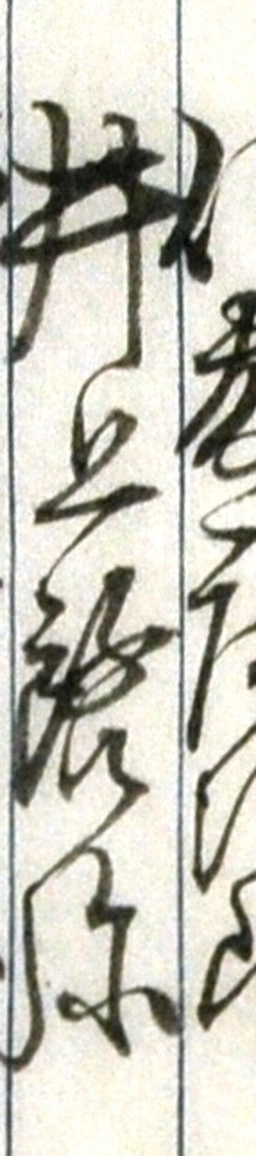井上啓弥
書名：上方ヨリ御帰府之後江戸勤并江戸在番中之者江被下・控
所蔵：伊那市立高遠町図書館・合同会社AMANE
